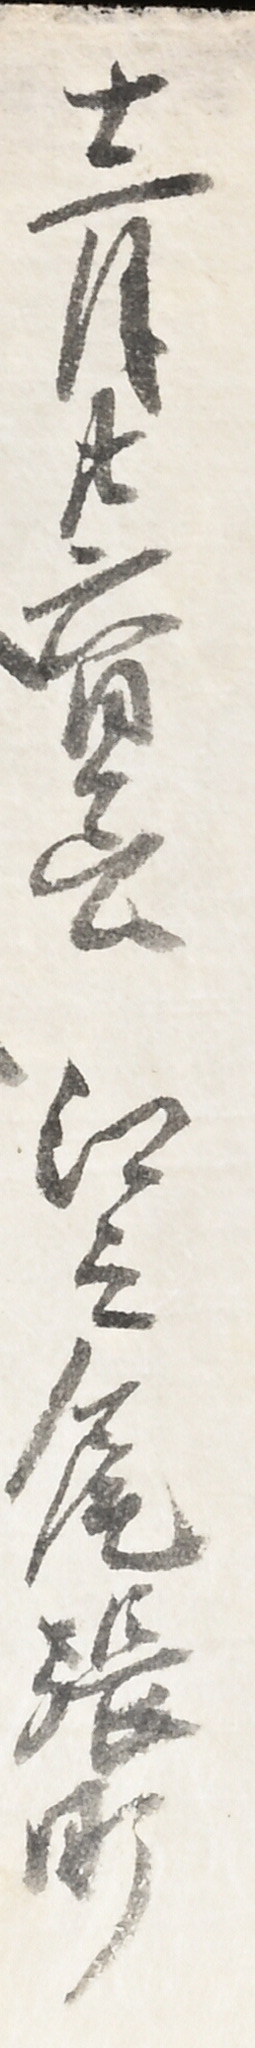十二月廿六日着江戸尾張町
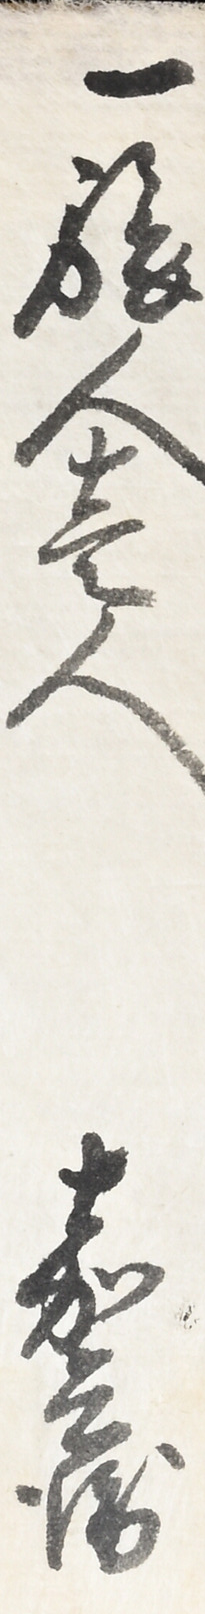一旅人壱人喜兵衛
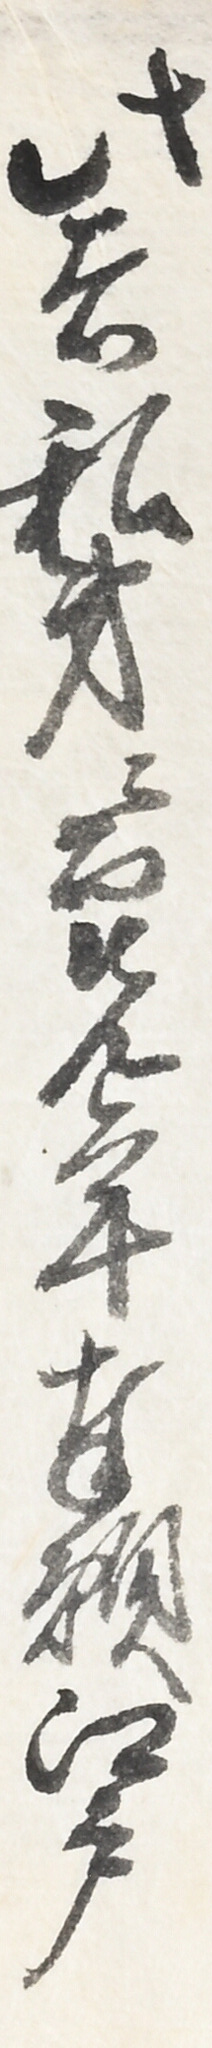此者私弟ニ而先年奉願江戸
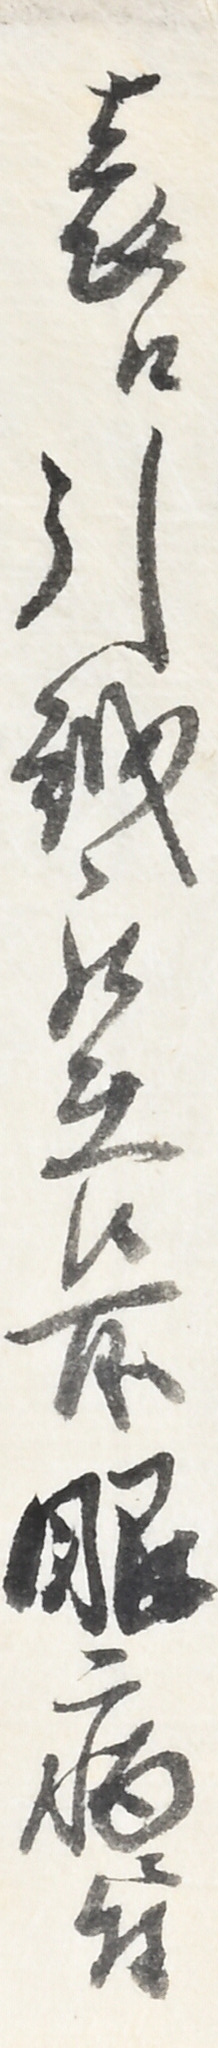表江引越罷在候所眼病ニ付
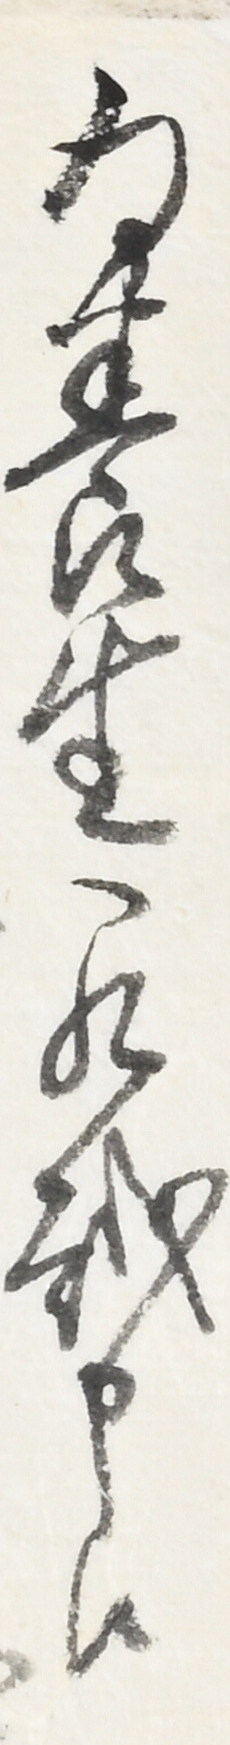為養生罷越申候
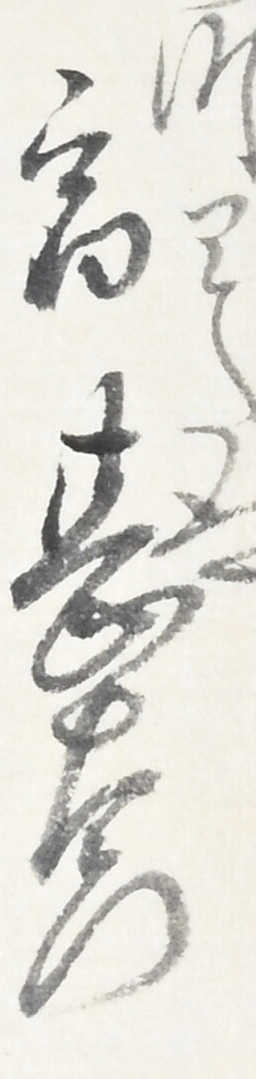宿甚右衛門
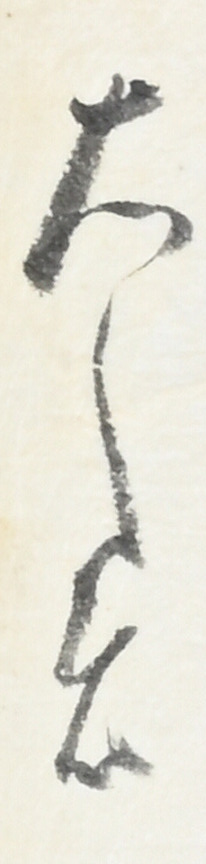右之者

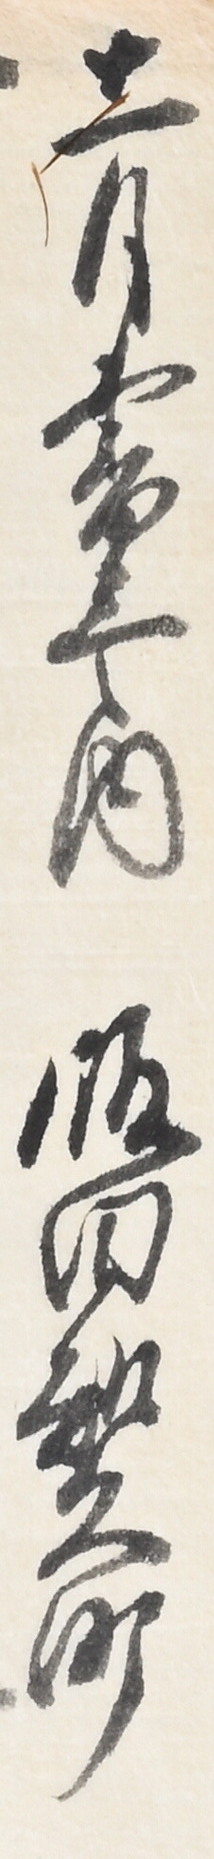十一月書上之内飯田桜町
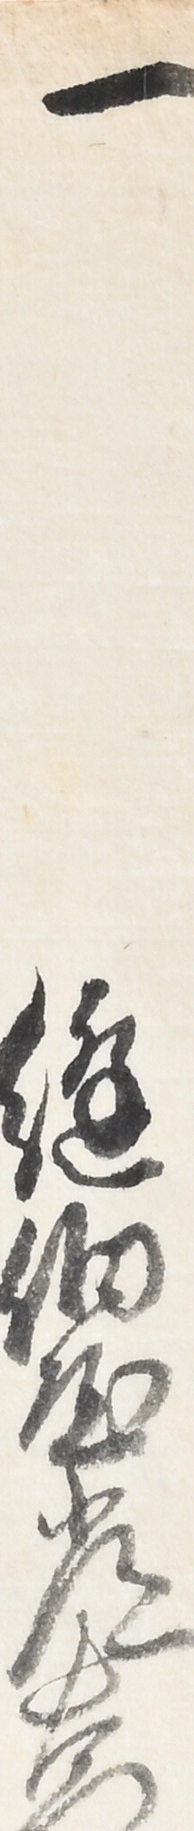一縫伯屋常右衛門
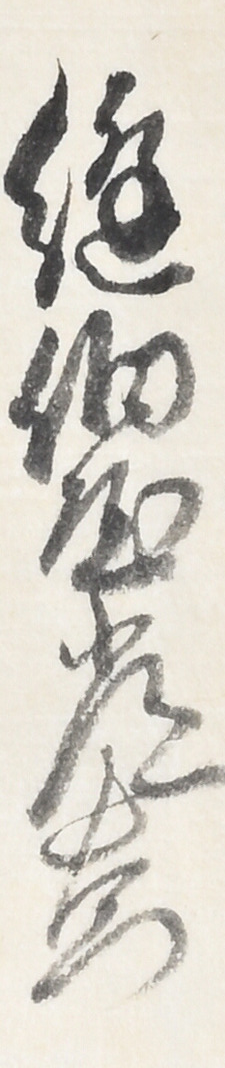一縫伯屋常右衛門
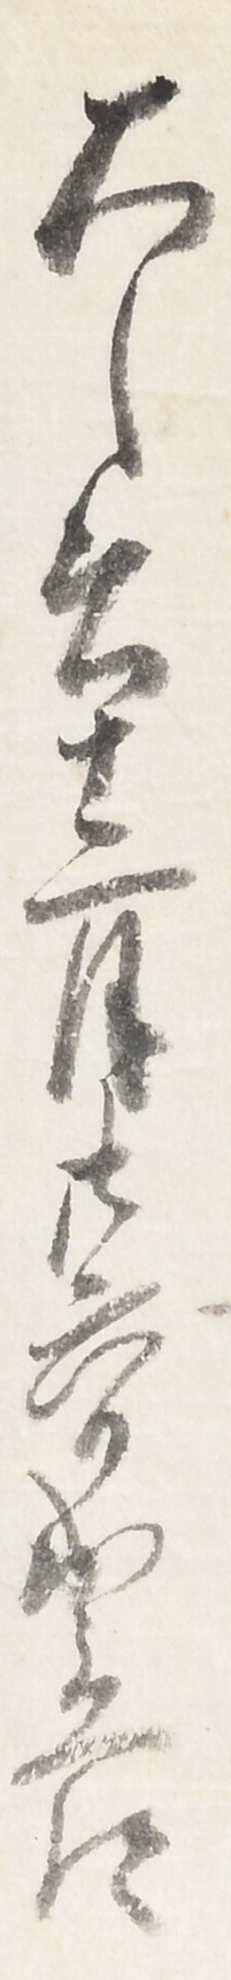右之者十二月廿肋日出立仕候
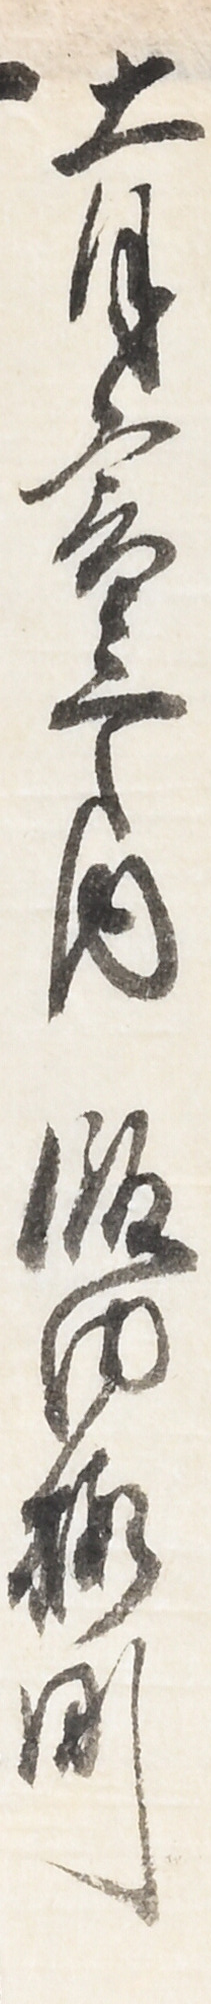十一月書上之内飯田桜町
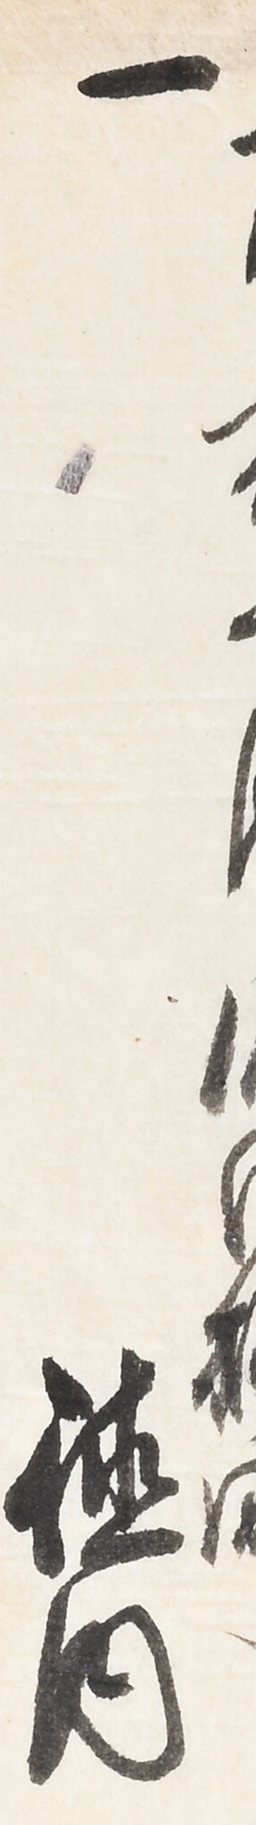一徳内
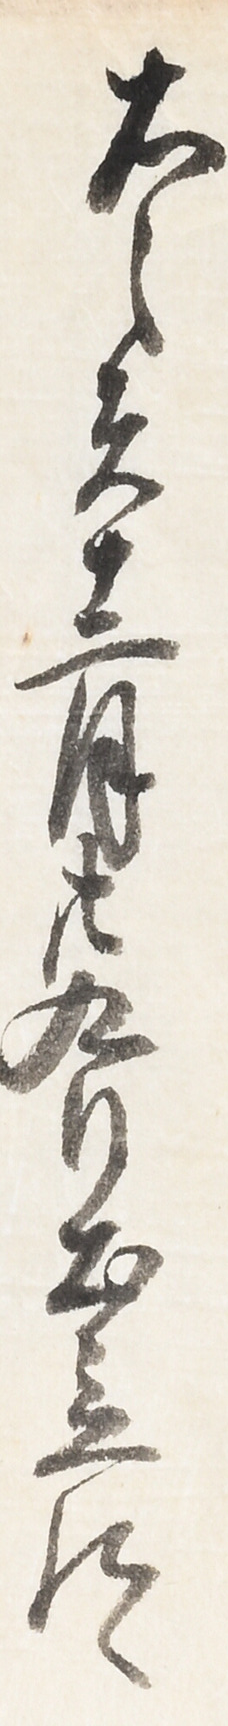右之者十二月廿九日出立仕候
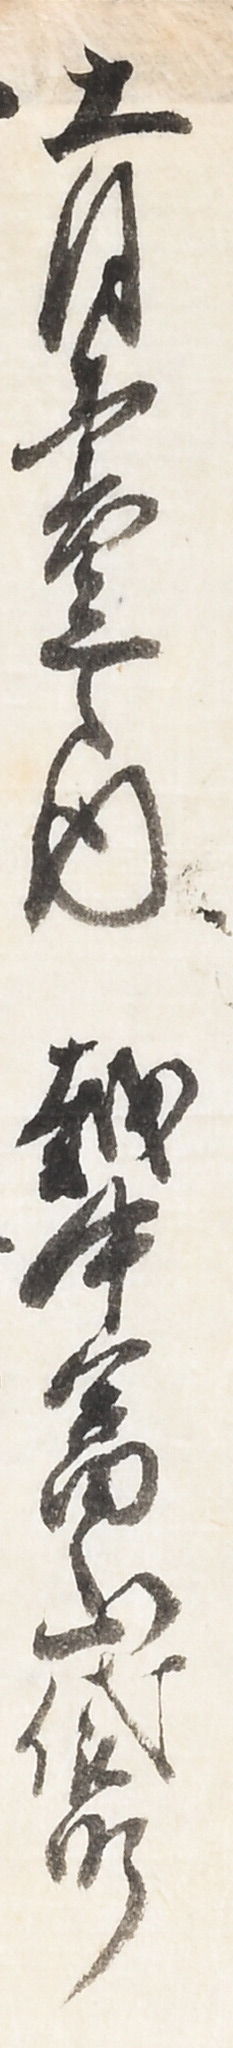十一月書上之内越中冨山代官町
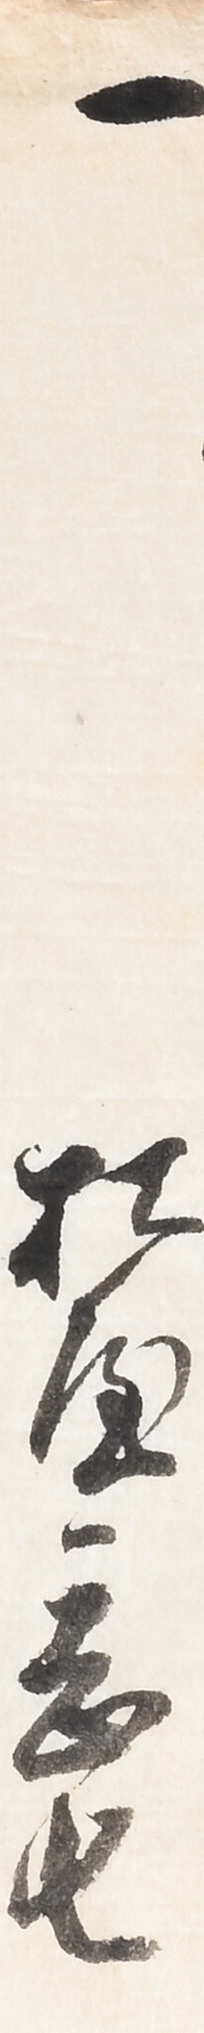一松屋甚七
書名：旅人泊控帳
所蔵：伊那市立高遠町図書館・合同会社AMANE
